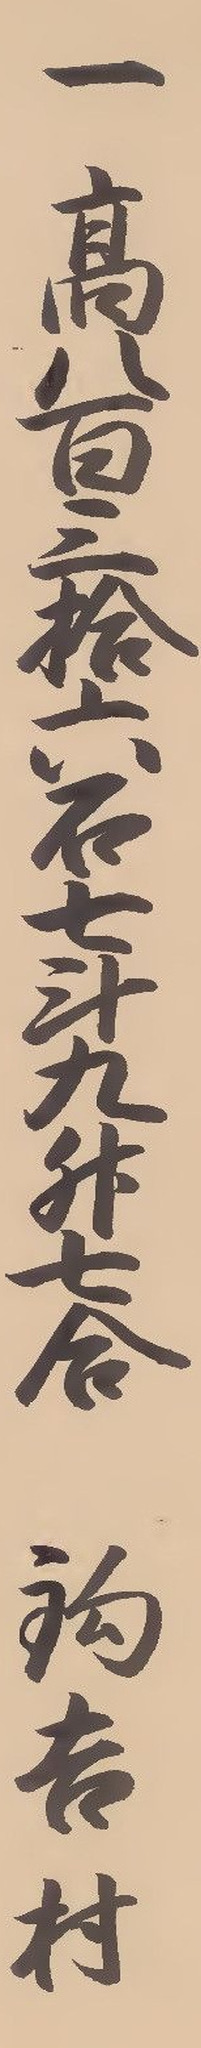一高八百三拾六石七斗九升七合釣吉村
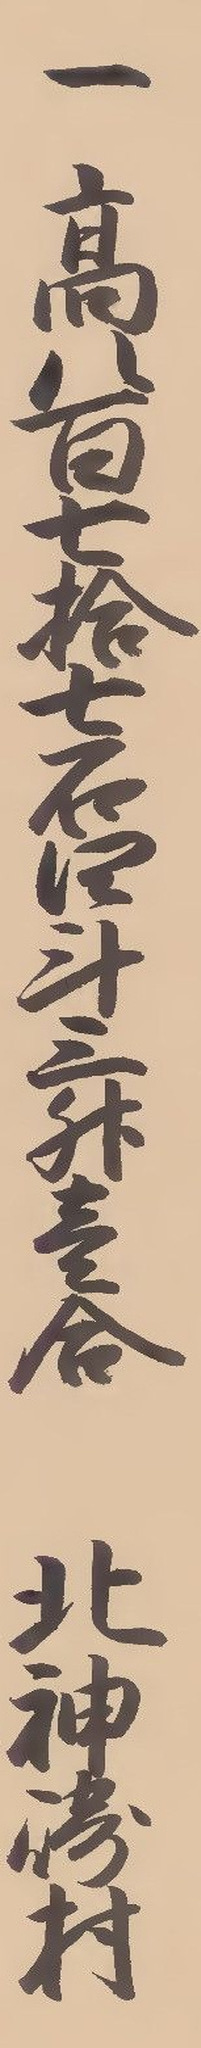一高八百七拾七石四斗三升壱合北神崎村

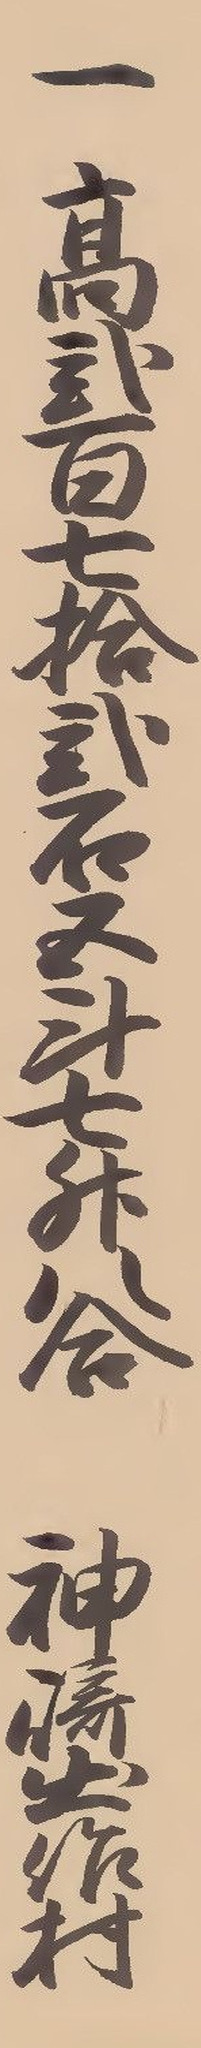一高弐百七拾弐石五斗七升八合神崎出作村
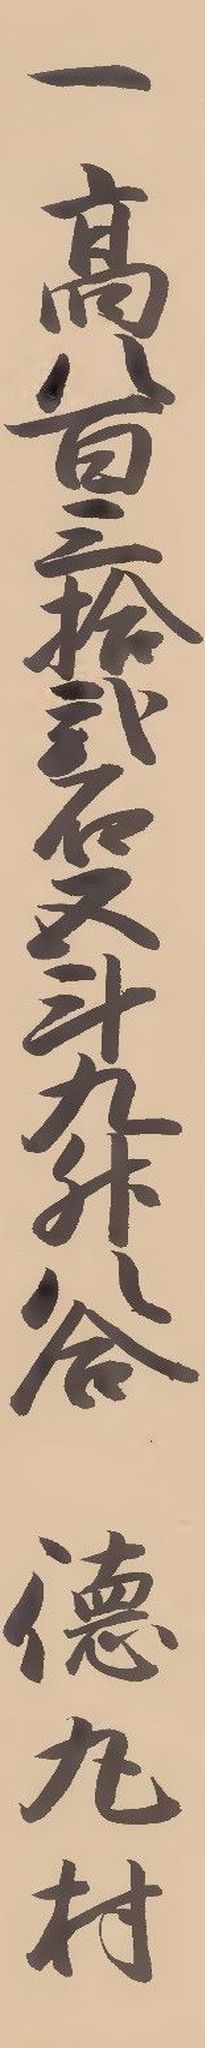一高八百三拾弐石五斗九升八合徳丸村
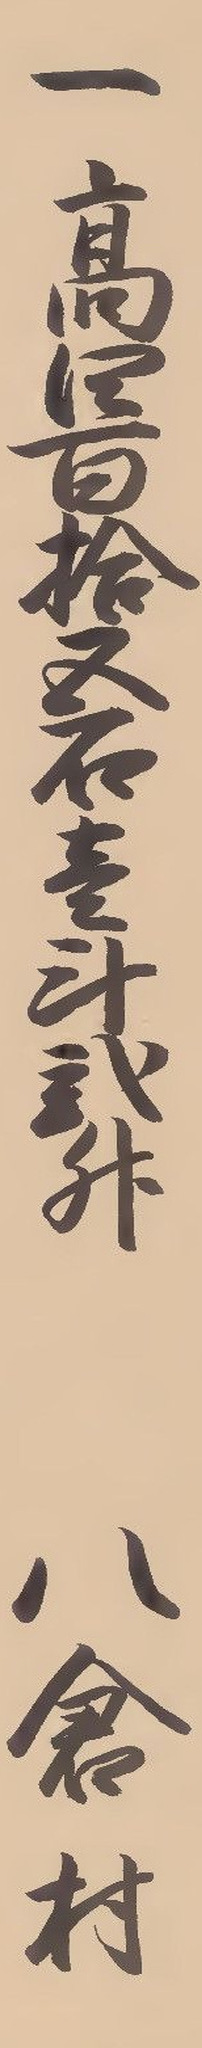一高四百拾五石壱斗弐升八倉村
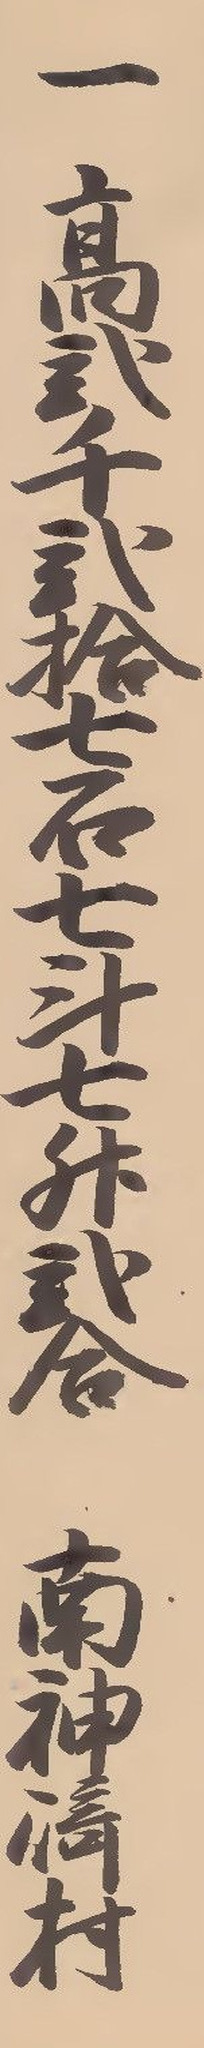一高弐千弐拾七石七斗七升弐合南神崎村
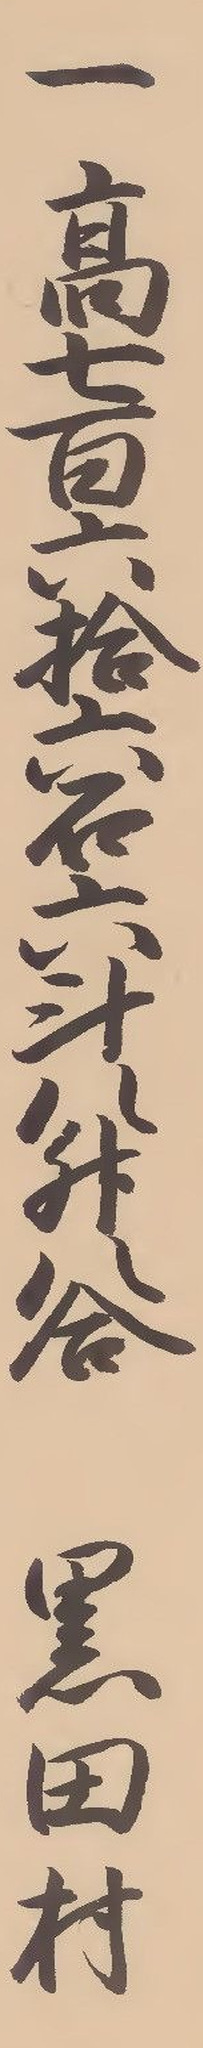一高七百六拾六石六斗八升八合黒田村
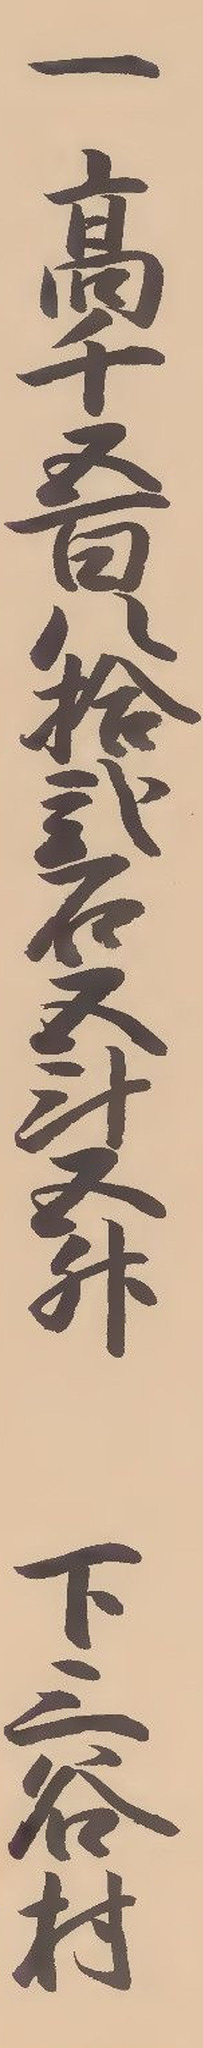一高千五百八拾弐石五斗五升下三谷村

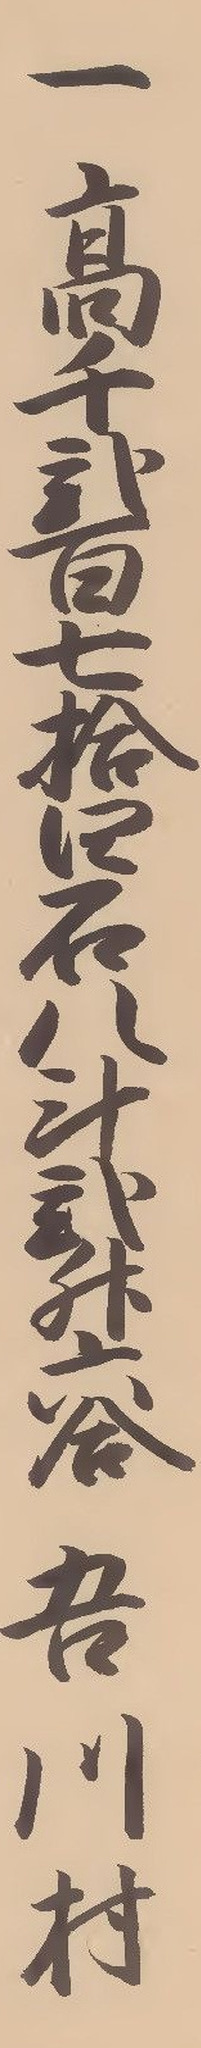一高千弐百七拾四石八斗弐升六合吾川村
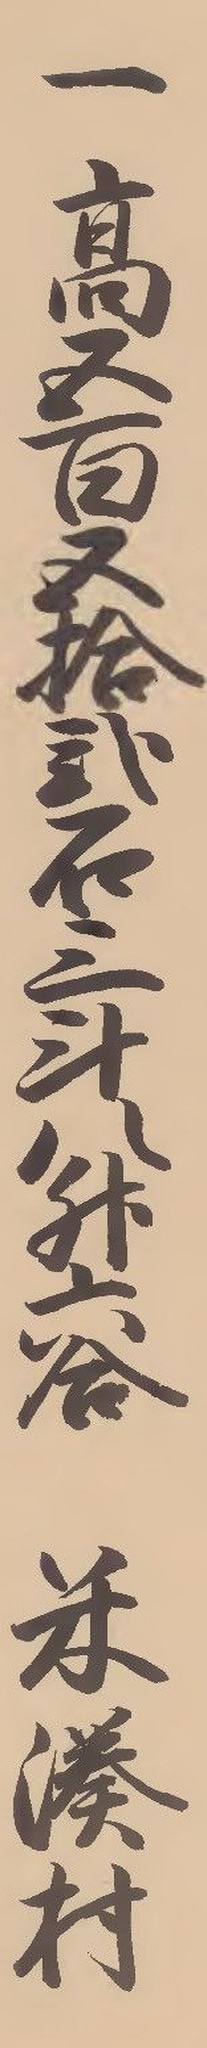一高五百五拾弐石三斗八升六合米湊村
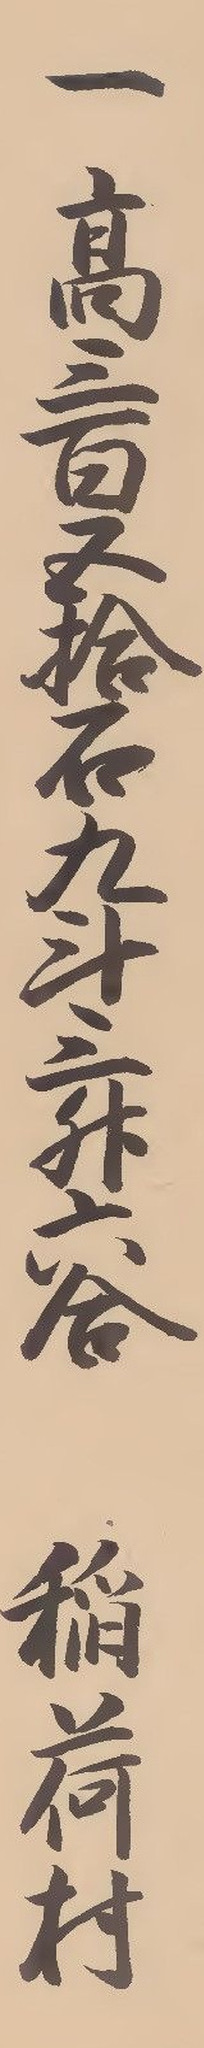一高三百五拾石九斗三升六合稲荷村
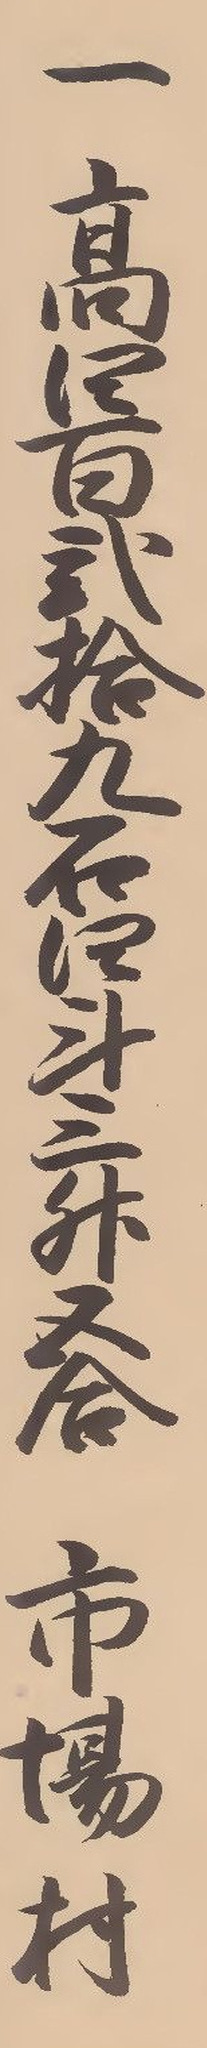一高四百弐拾九石四斗三升五合市場村
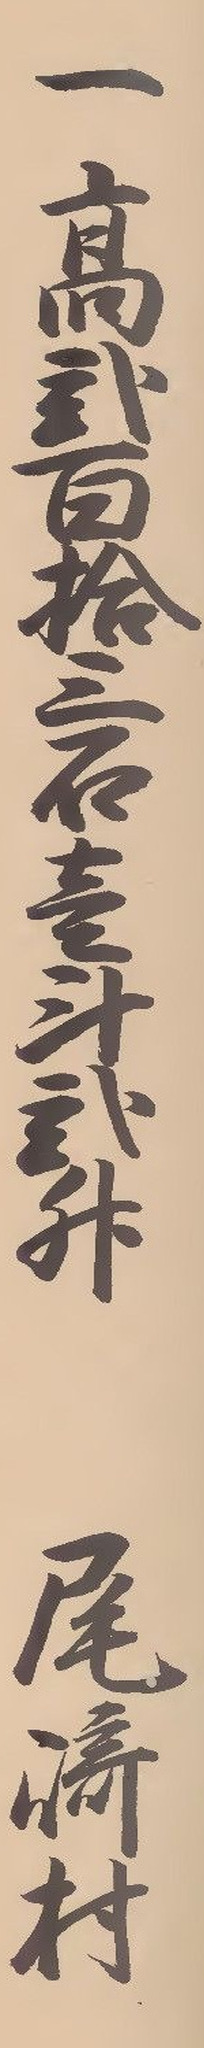一高弐百拾三石壱斗弐升尾崎村
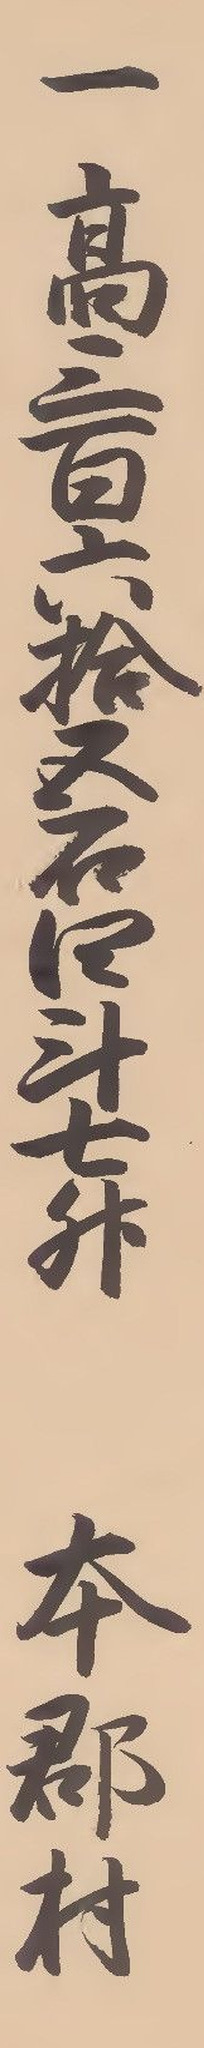一高三百六拾五石四斗七升本郡村
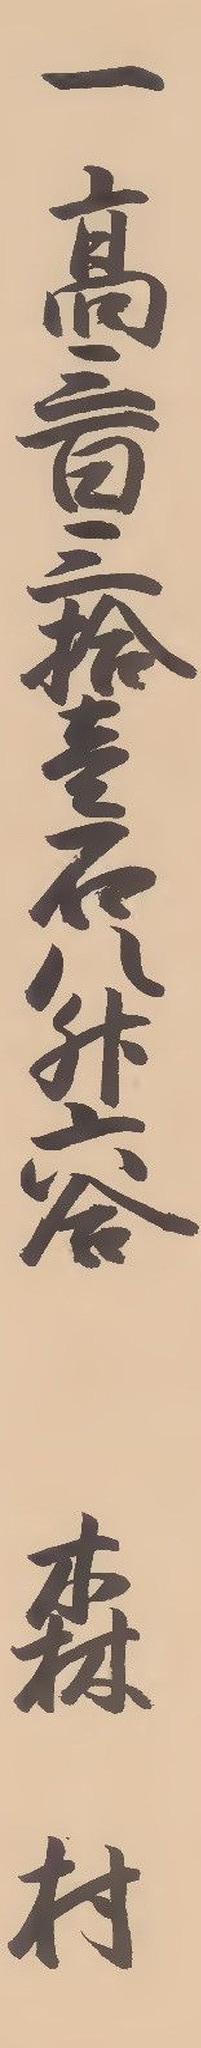一高三百三拾壱石八升六合森村
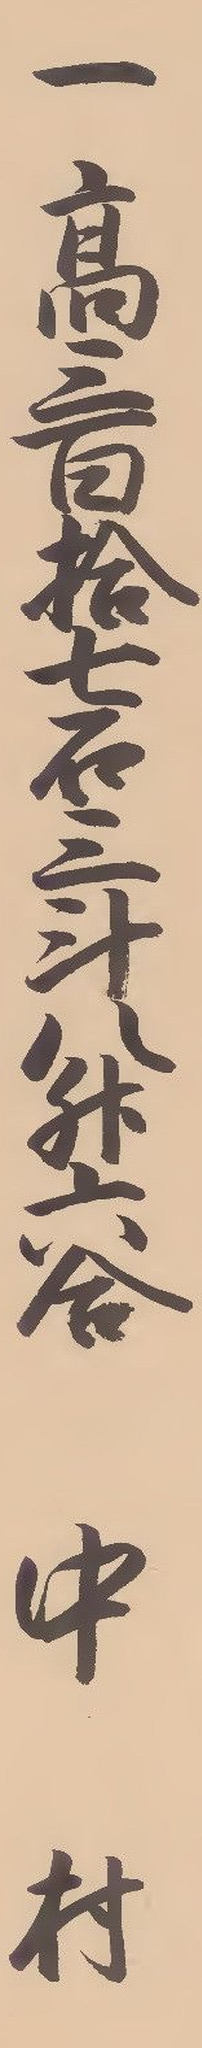一高三百拾七石三斗八升六合中村
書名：伊予国郷帳
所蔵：国立公文書館 National Archives of Japan
